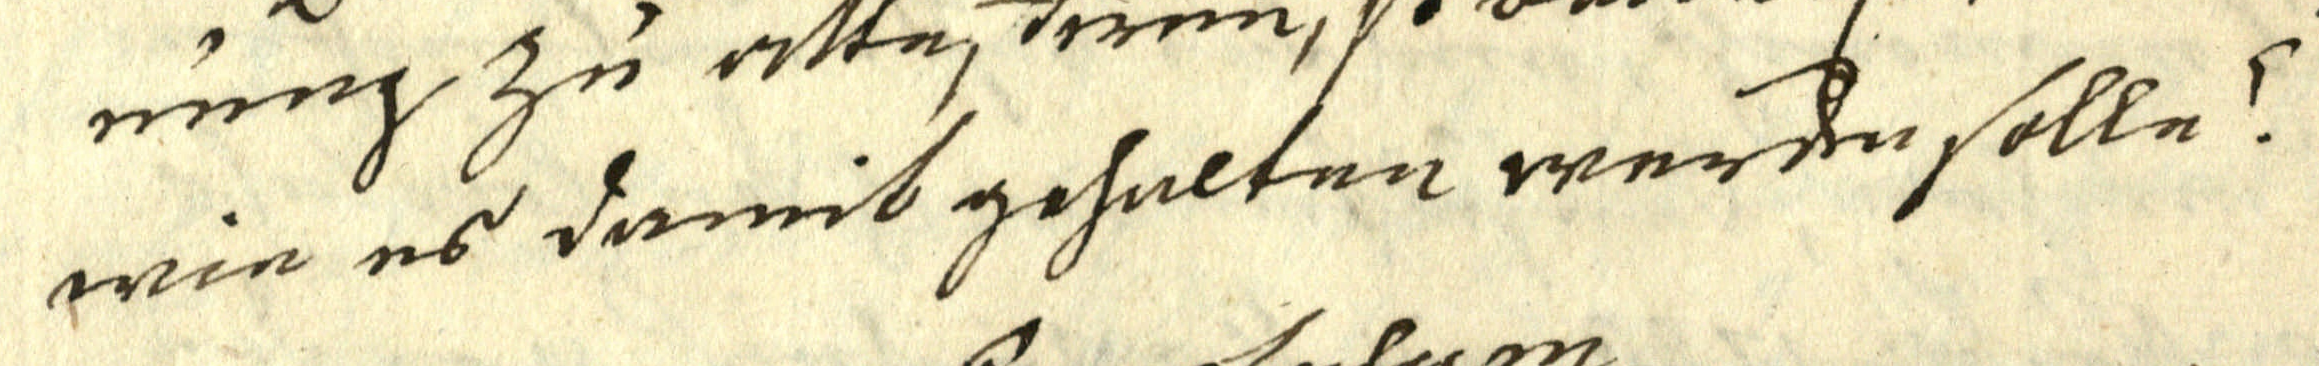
wie es damit gehalten werden solle?
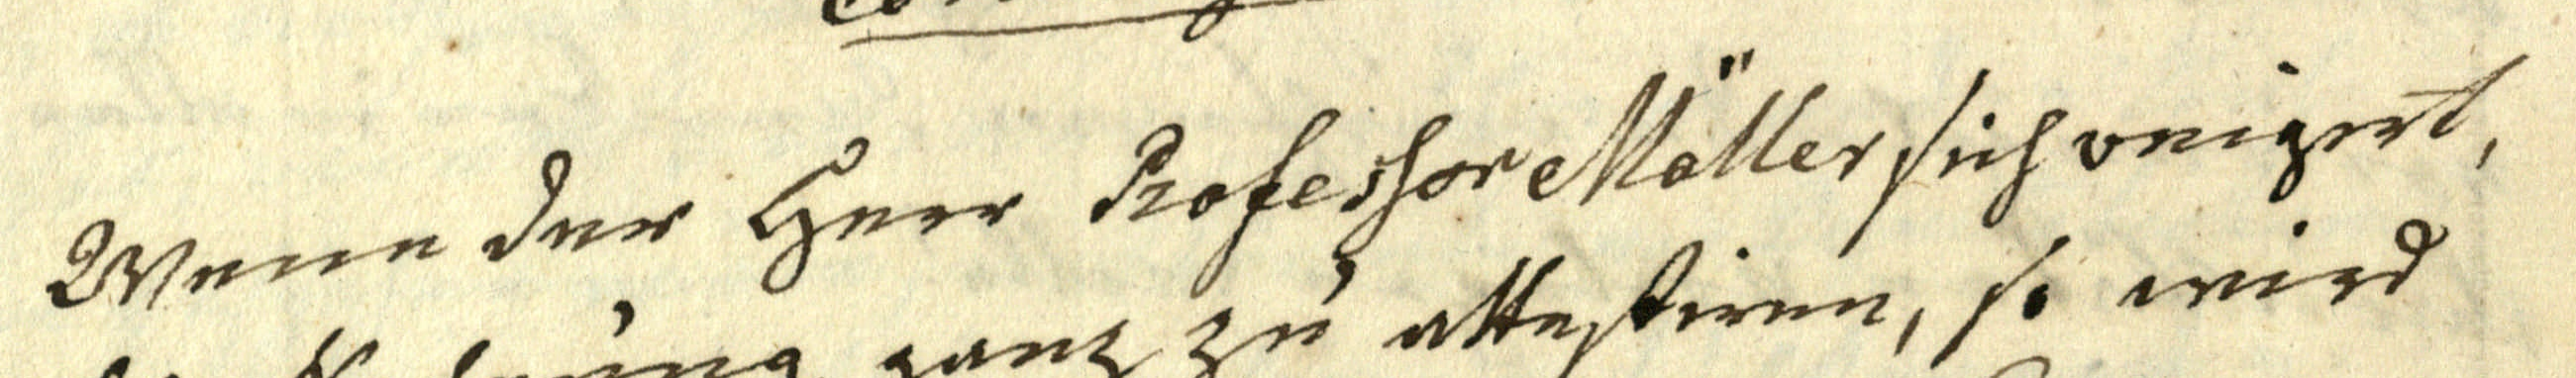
Wann der Herr Professor Möller sich weigert,
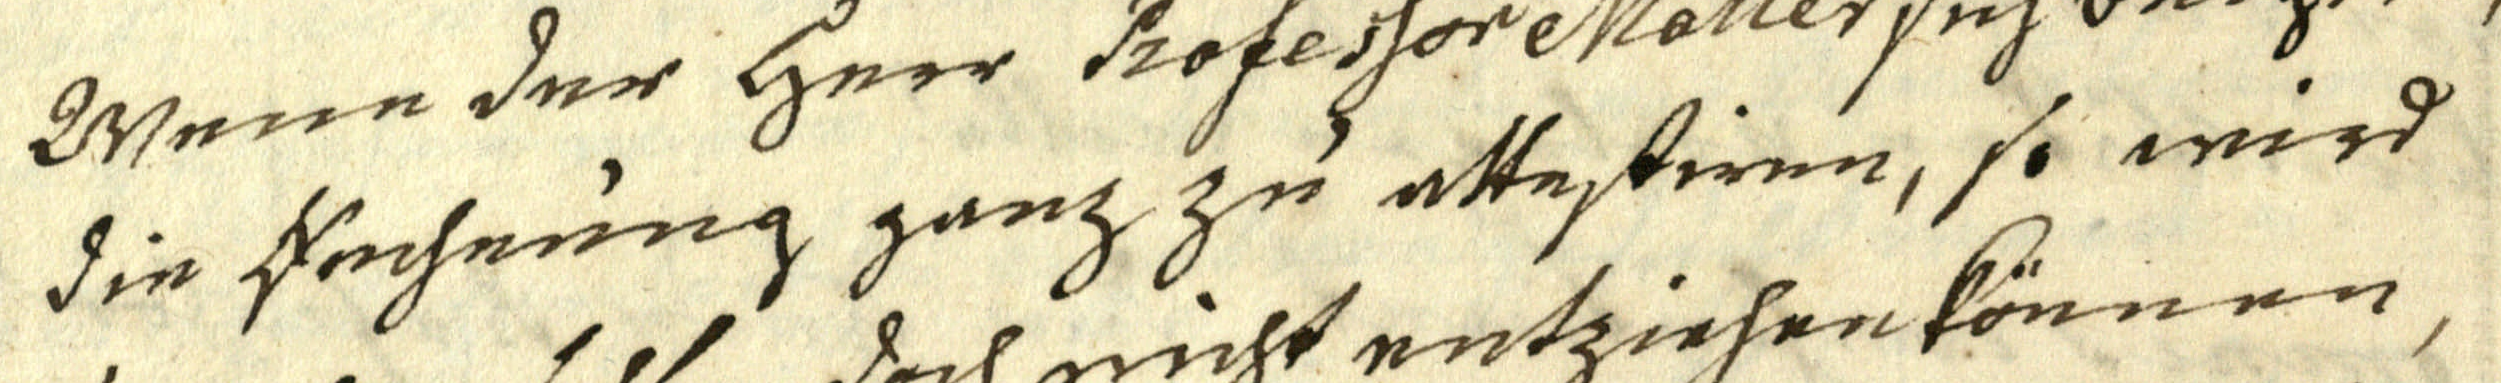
die Rechnung ganz zu attestiren, so wird
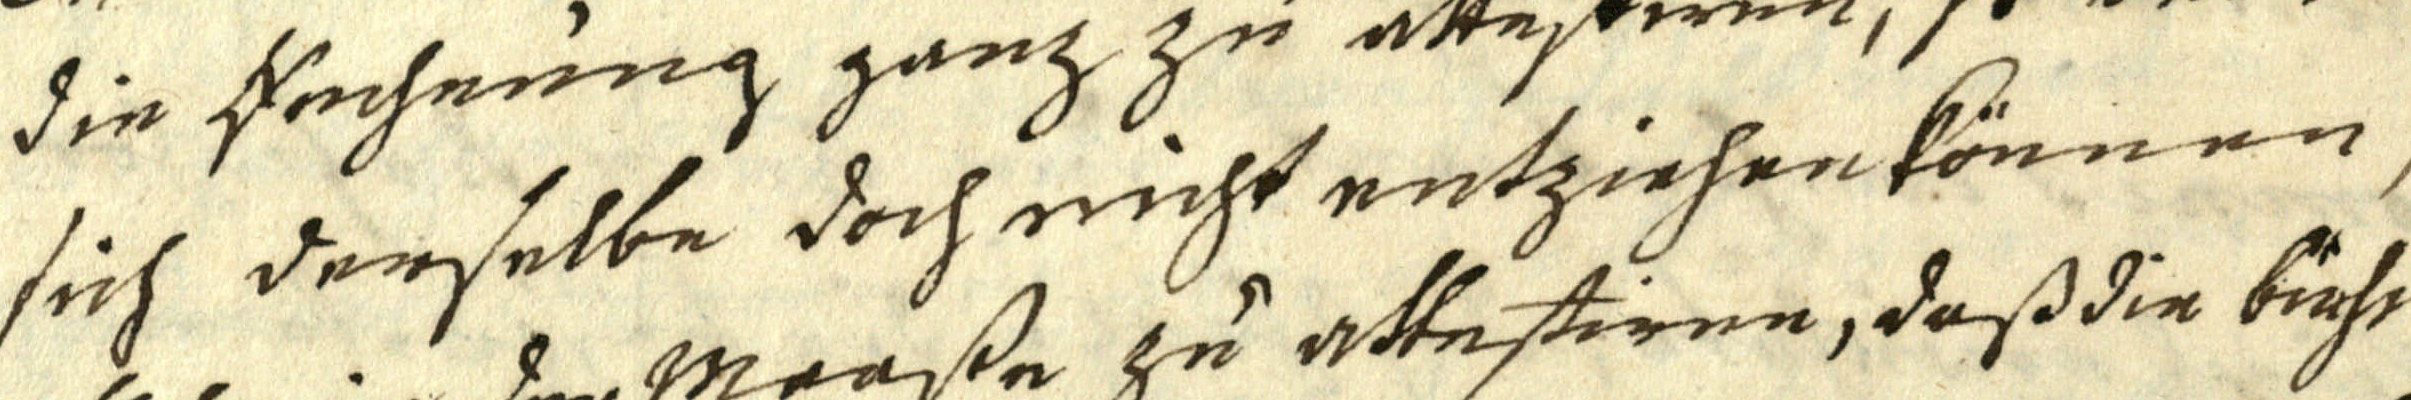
sich derselbe doch nicht entziehen können,
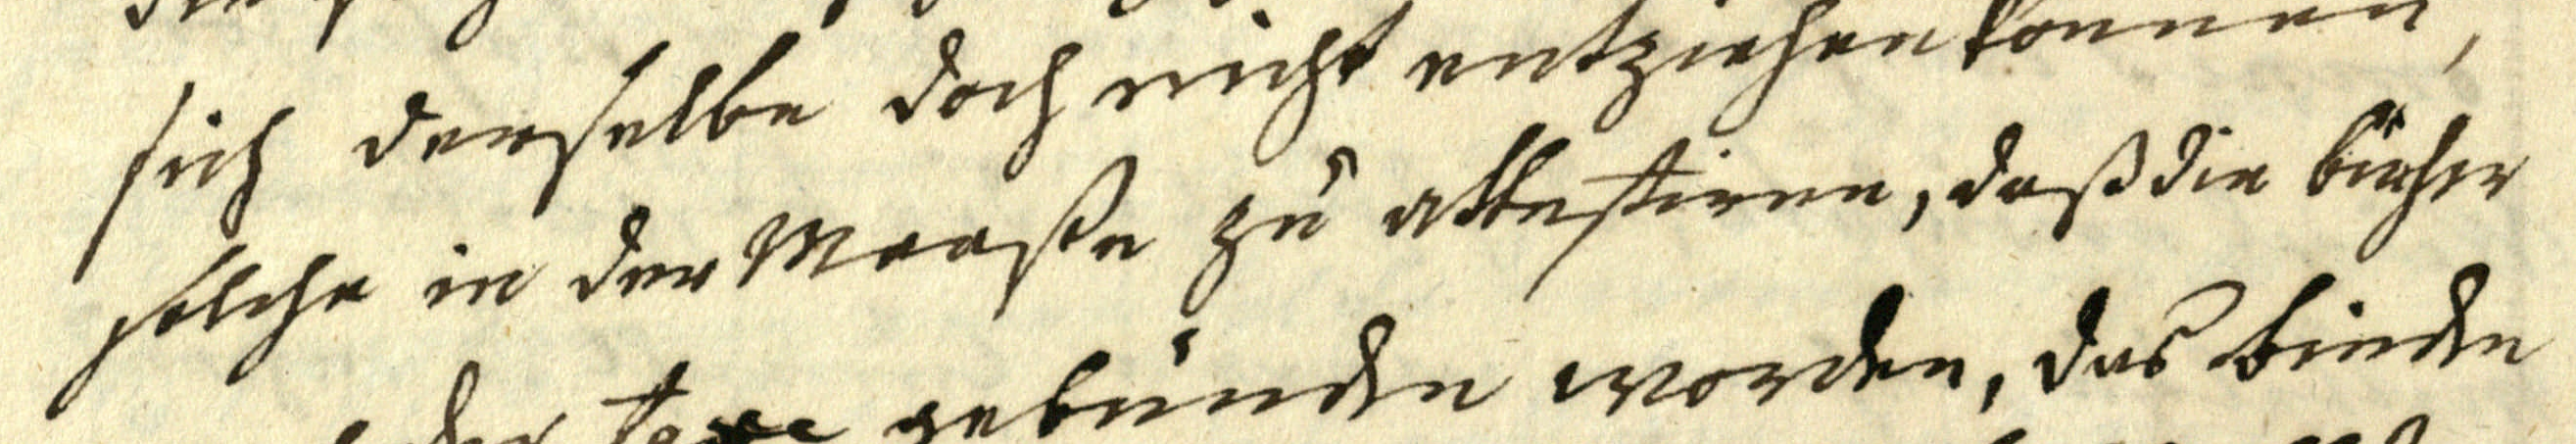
solche in der Maaße zu attestiren, daß die Bücher
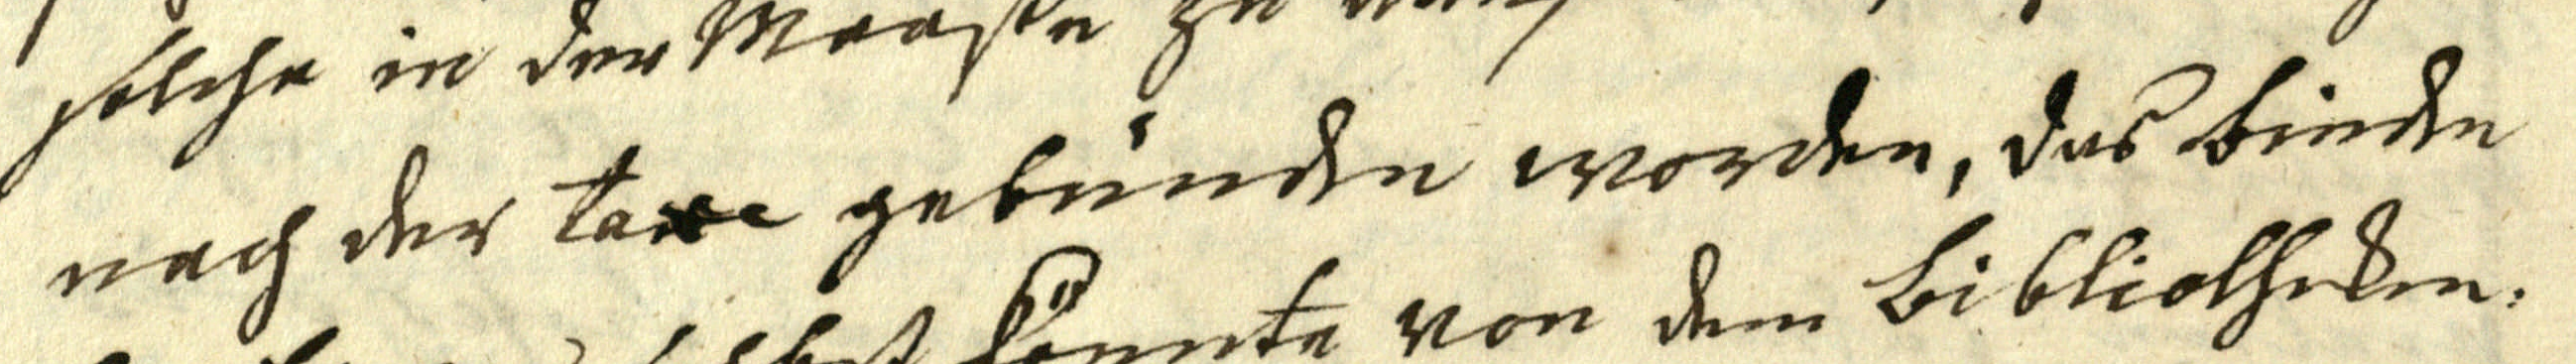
nach der Taxe gebunden worden, das Binden
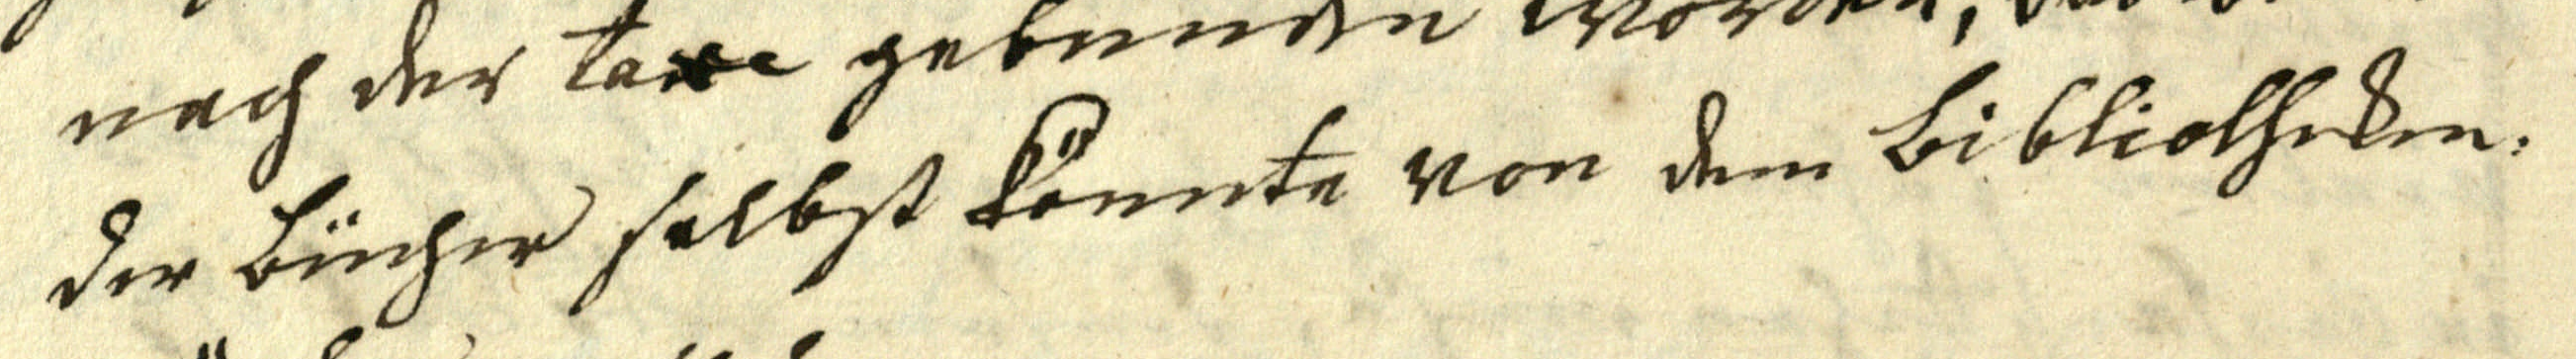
die Bücher selbst könnte von dem Bibliotheken¬
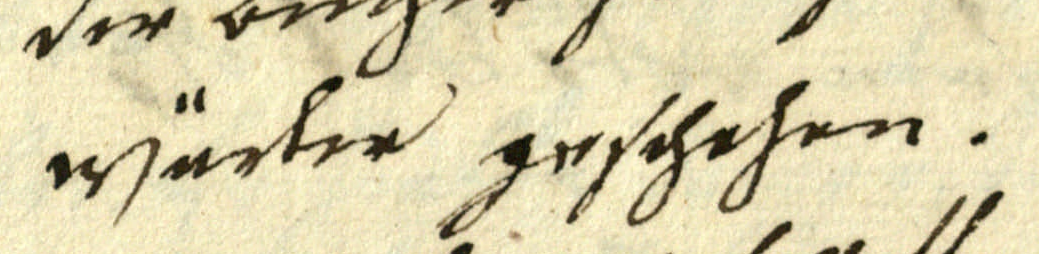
wärter geschehen.
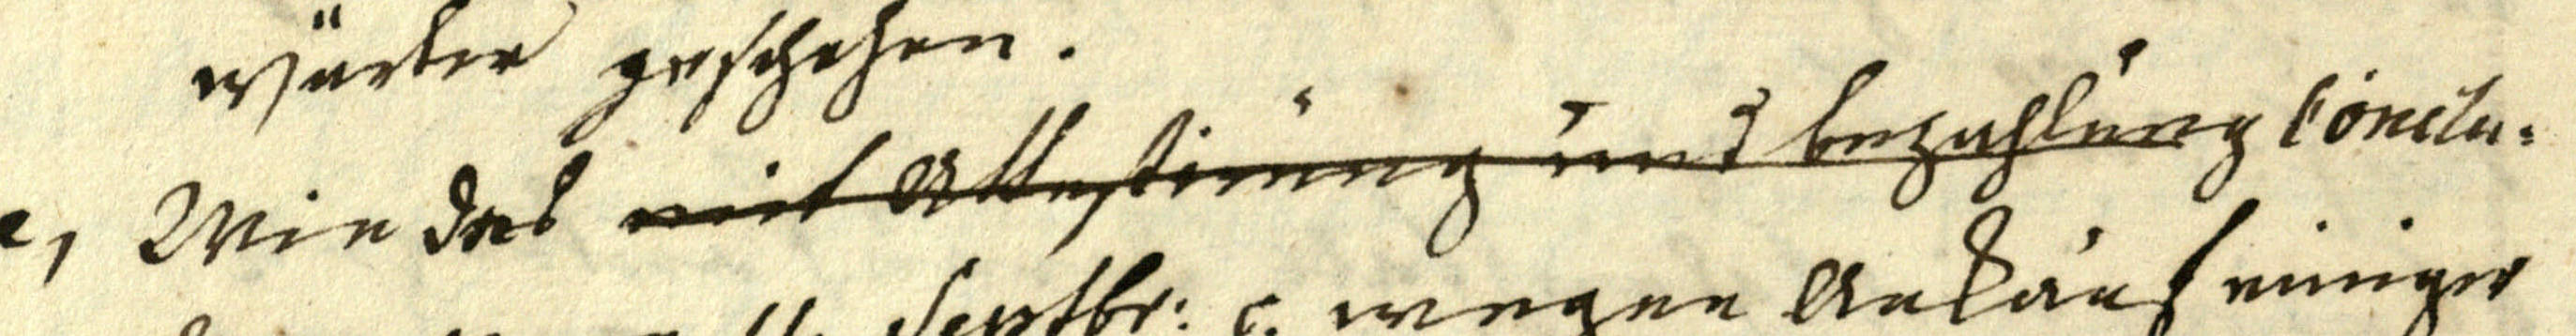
2, Wie das mit Attestirung und Bezahlung Concl¬
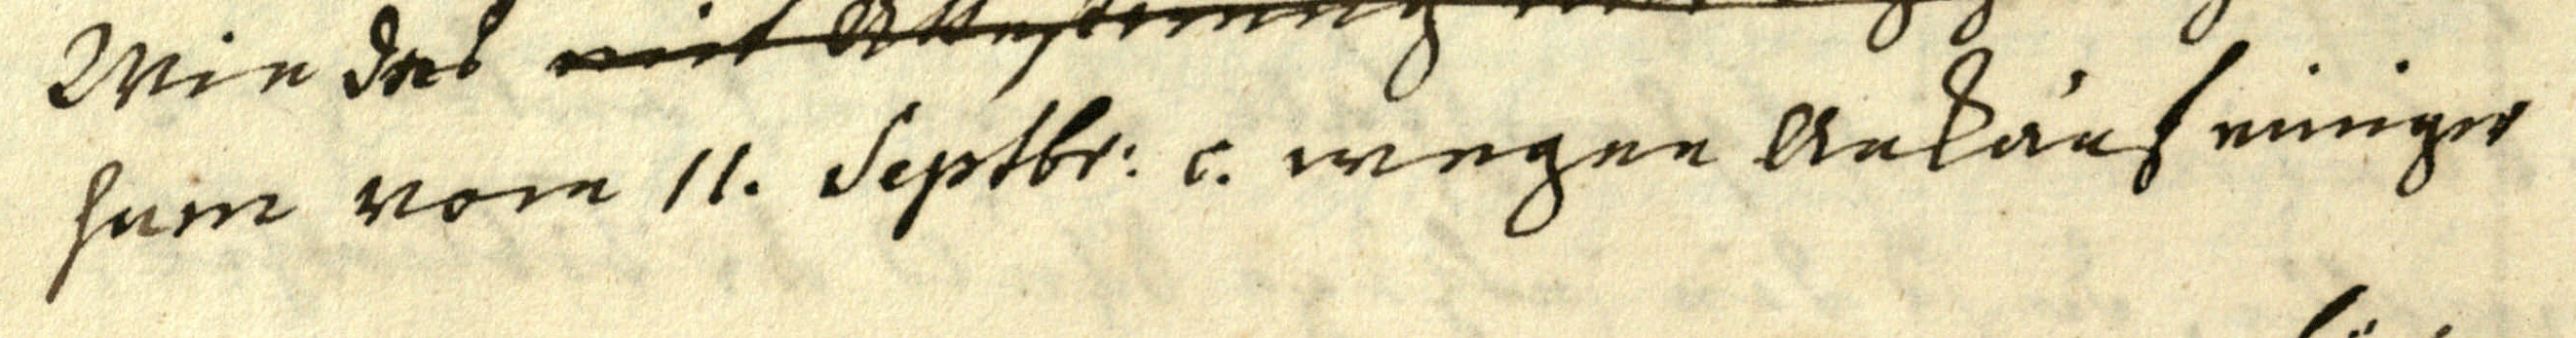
sum vom 11. Septbr. c. wegen Ankauf einiger
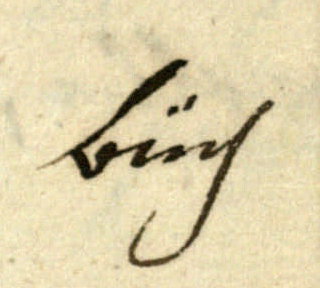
Büch
